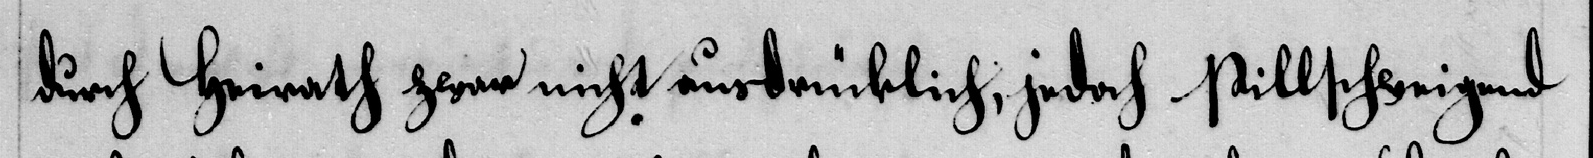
durch Heirath zwar nicht ausdrücklich, jedoch stillschweigend
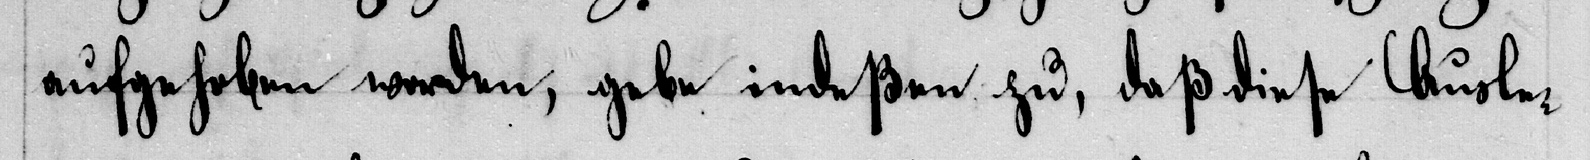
aufgegeben worden, gebe indeßen zu, daß diese Ausle¬
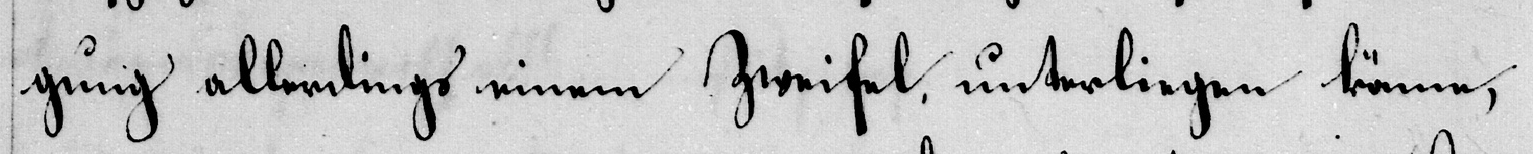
gung allerdings einem Zweifel unterliegen könne,
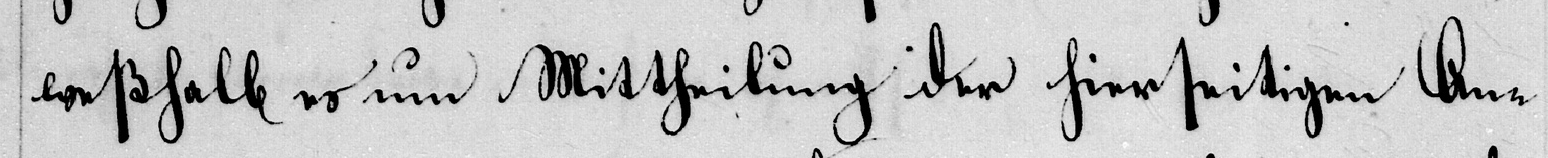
weßhalb es nun Mittheilung der hierseitigen An¬
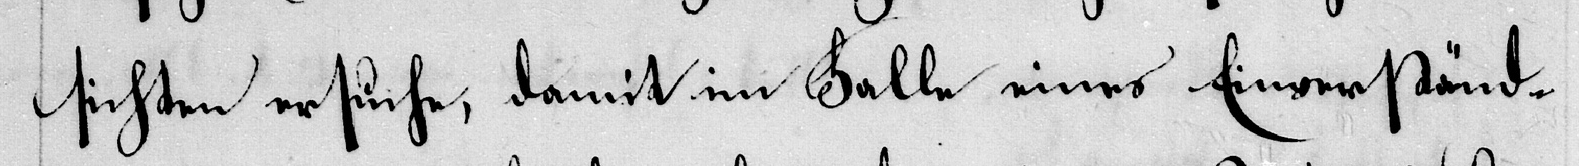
sichten ersuche, damit im Falle eines Einverständ¬
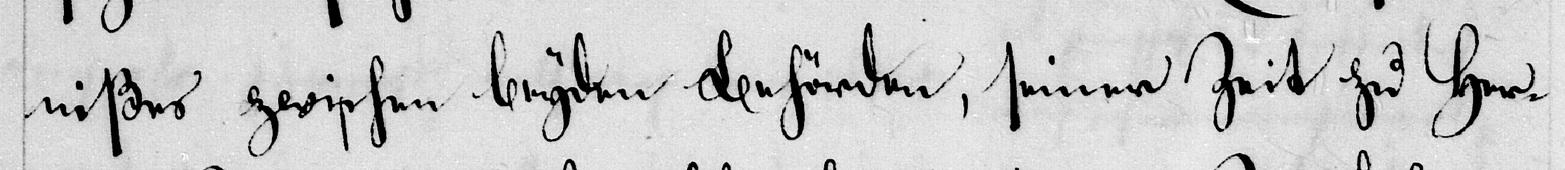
nißes zwischen beyden Behörden, seiner Zeit zu Her¬
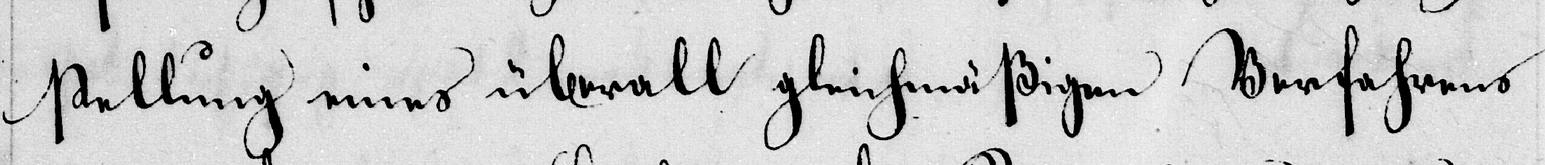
stellung eines überall gleichmäßigen Verfahrens
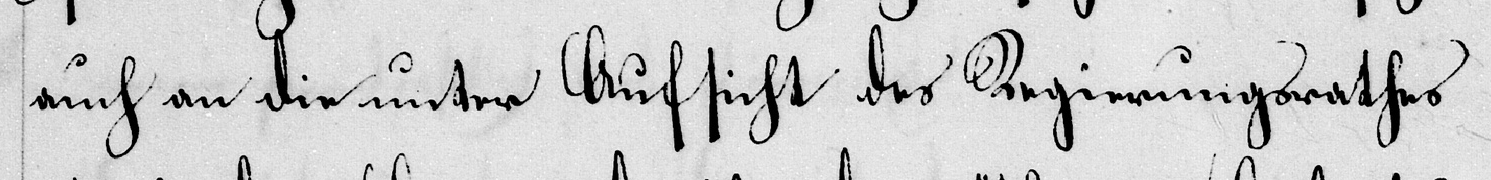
auch an die unter Aufsicht des Regierungsrathes
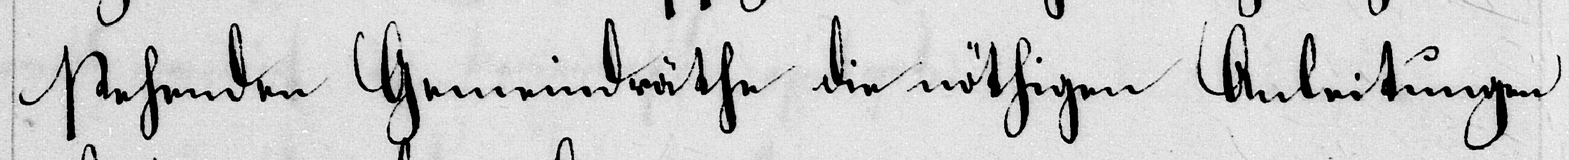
stehenden Gemeindräthe die nöthigen Anleitungen
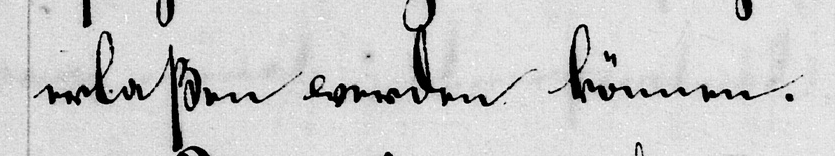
erlaßen werden können.
